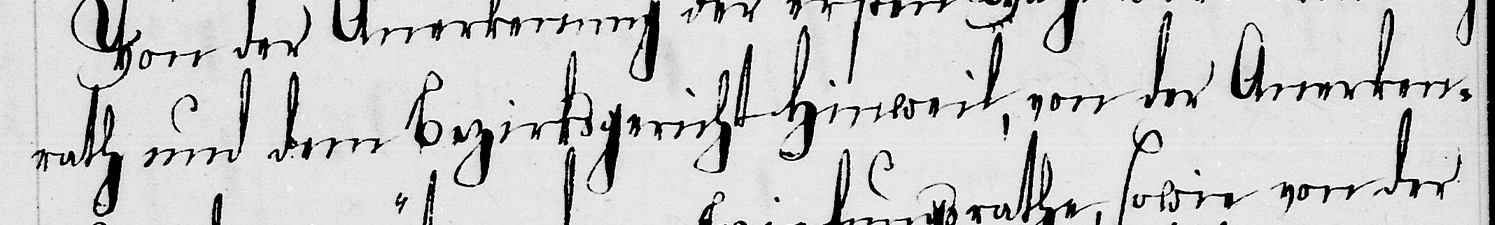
zrath und dem Bezirksgericht Hinweil, von der Anerken¬
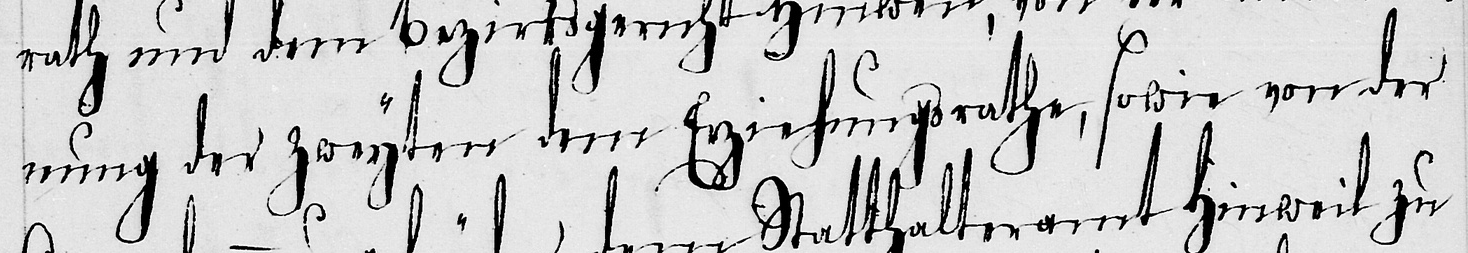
nung der zweyten dem Erziehungsrathe, sowie von der
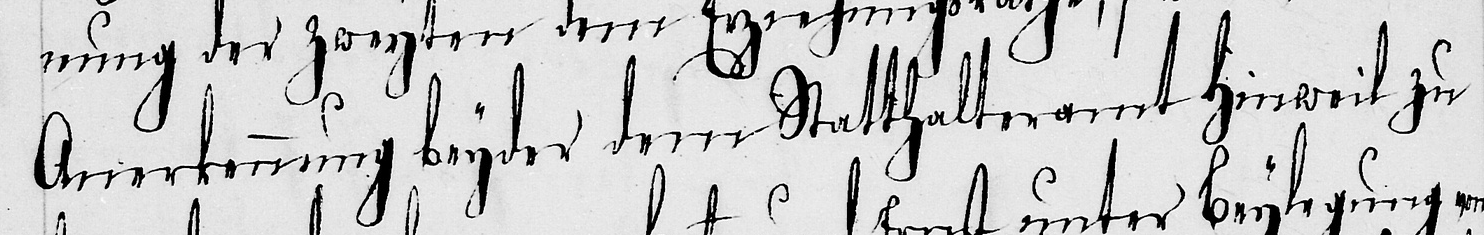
Anerkennung beyder dem Statthalteramt Hinweil zu
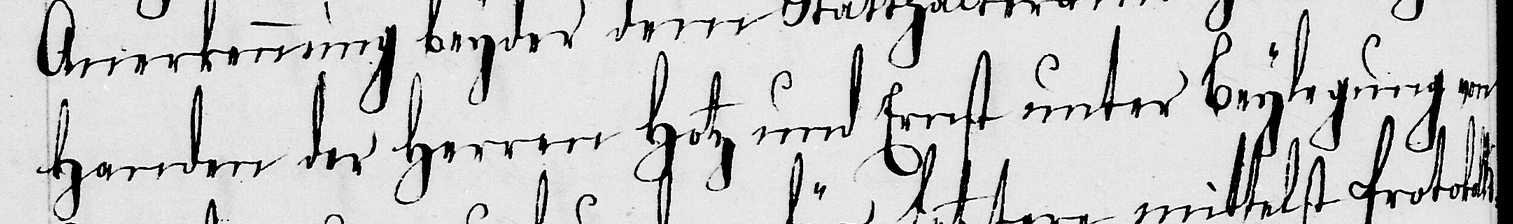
Handen der Herren Hotz und Ernst unter Beylegung von
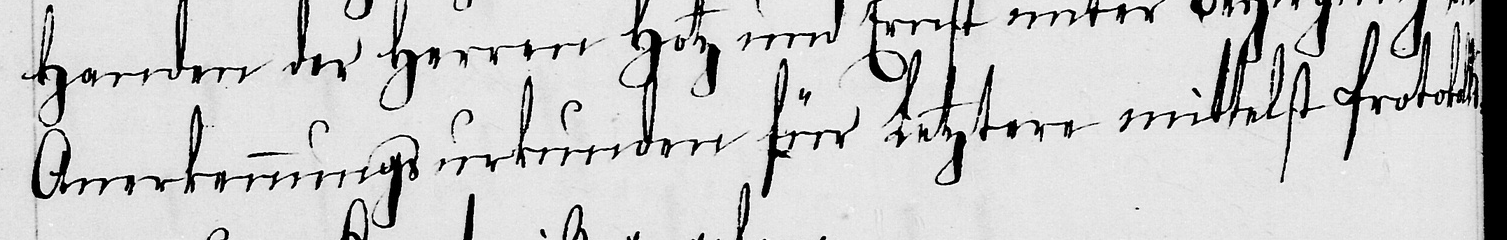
Anerkennungsurkunden für Letztere mittelst Prot¬
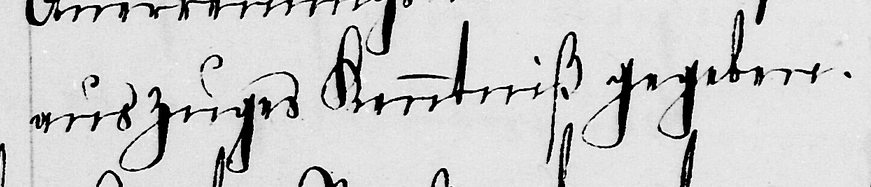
sauszuges Kenntniß gegeben.
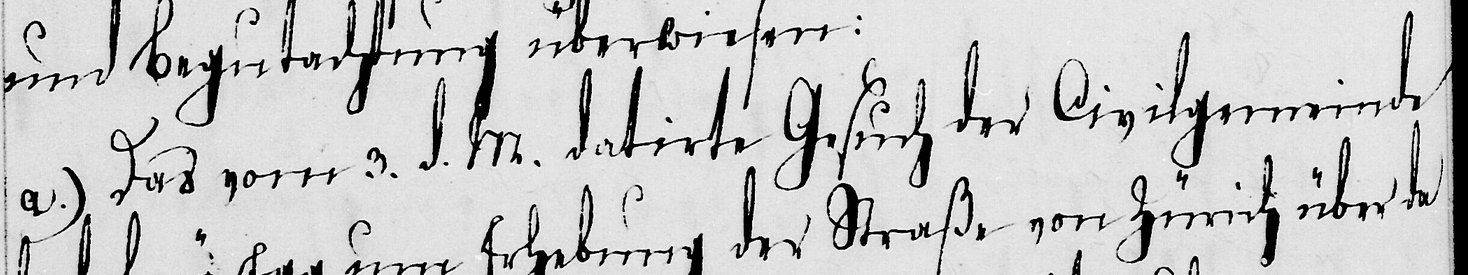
a.) Das vom 3. d. M. datirte Gesuch der Civilgemeinde
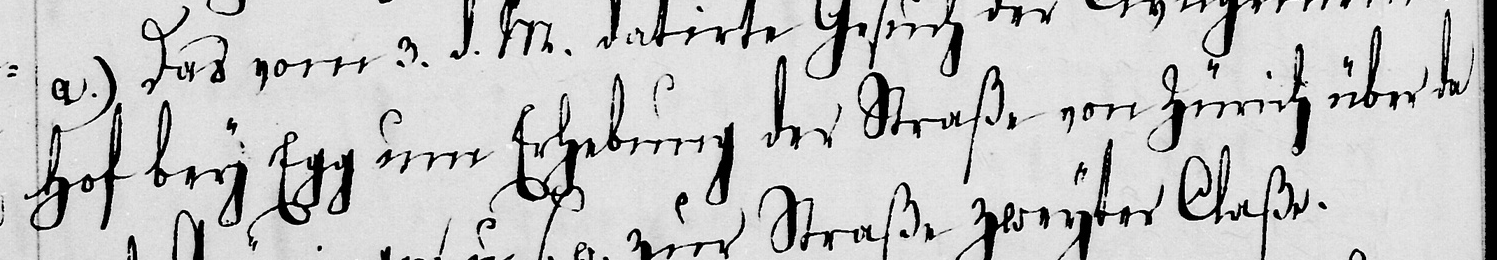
Hof bey Egg um Erhebung der Straße von Zürich über da
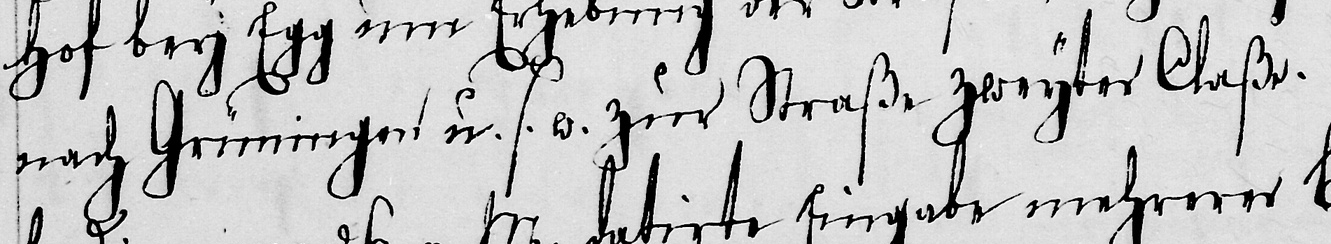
nach Grüningen u. s. w. zur Straße zweyter Claße.
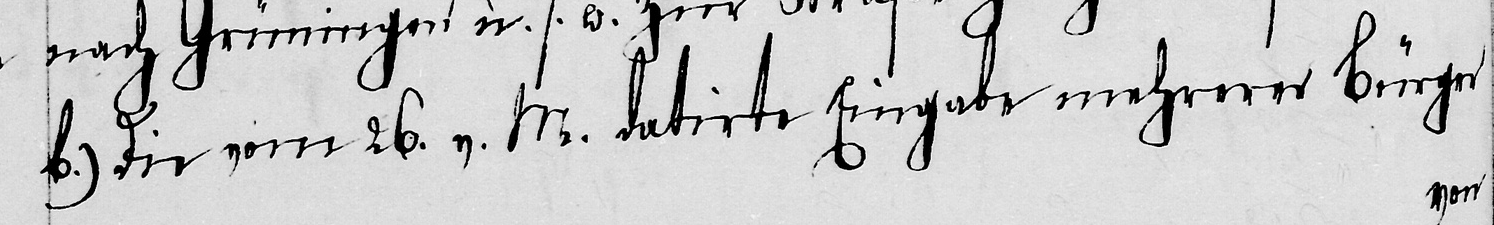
b.) Die vom 26. v. M. datirte Eingabe mehrerer Bürger
